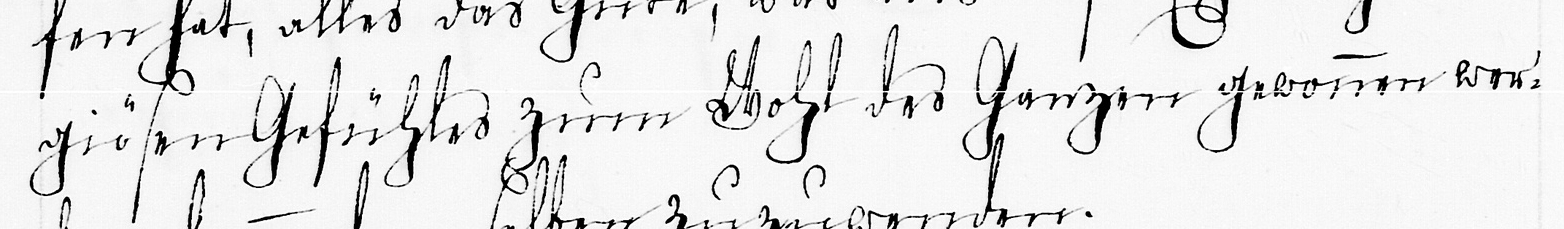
giösen Gefühles zum Wohl des Ganzen gewonnen wer¬
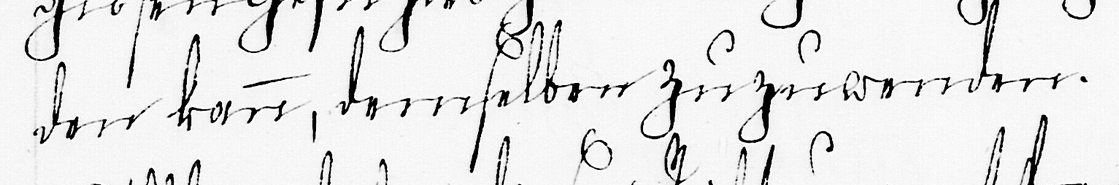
den kann, demselben zuzuwenden.
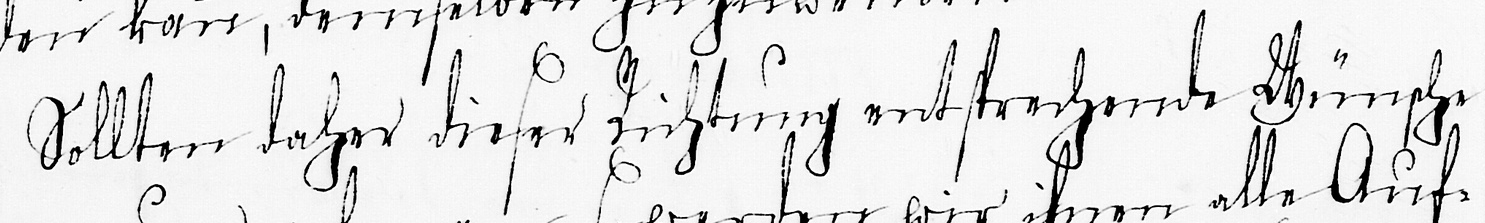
Sollten daher dieser Richtung entsprechende Wünsche
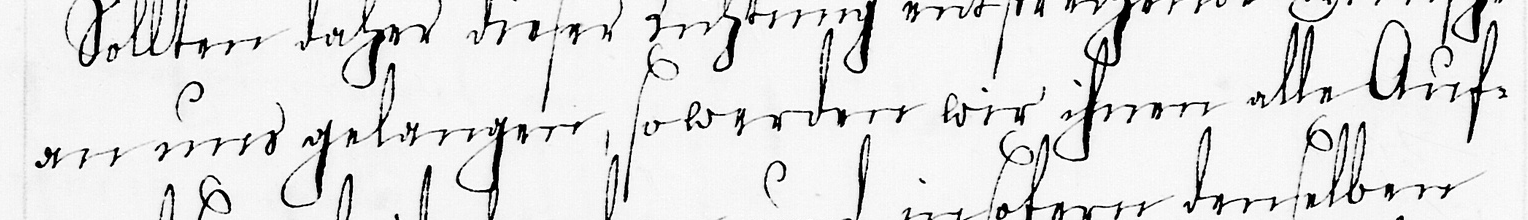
an uns gelangen, so werden wir ihnen alle Auf¬
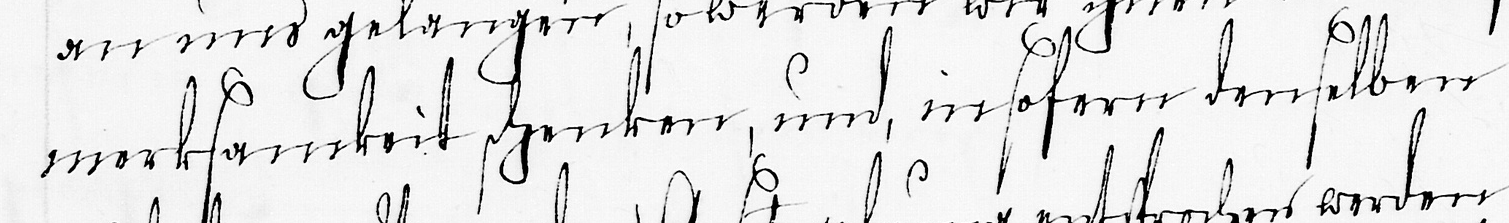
merksamkeit schenken, und, insofern denselben
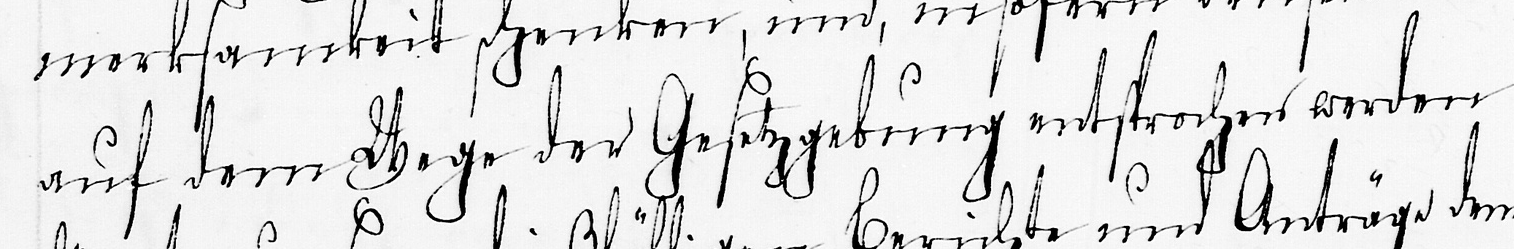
auf dem Wege der Gesetzgebung entsprochen werden
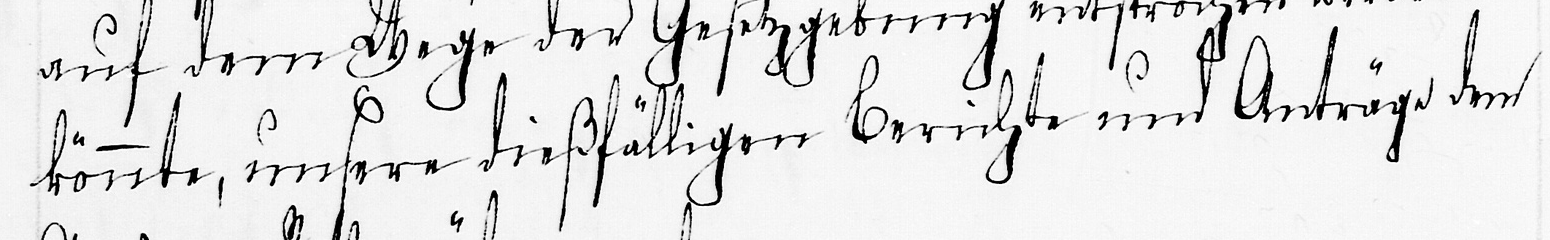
könnte, unsere dießfälligen Berichte und Anträge dem
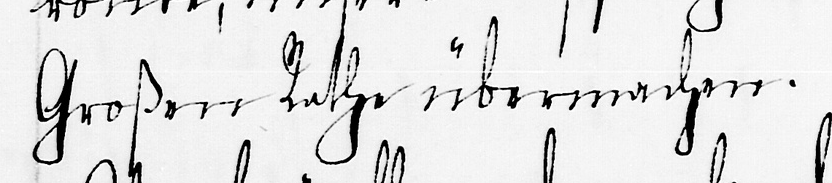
Großen Rathe übermachen.
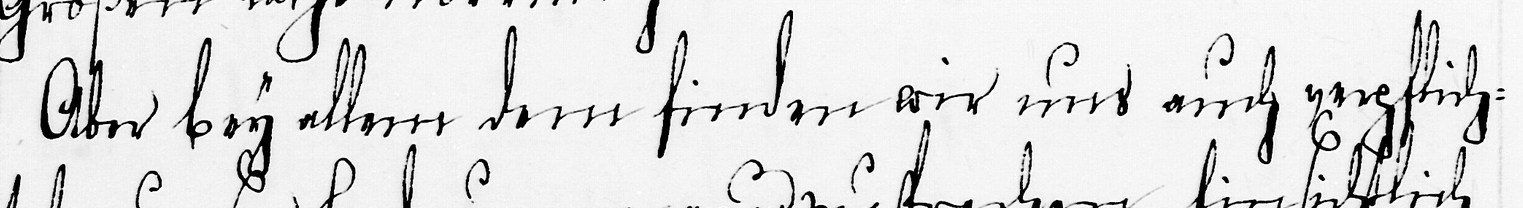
Aber bey allem dem finden wir uns auch verpflic¬
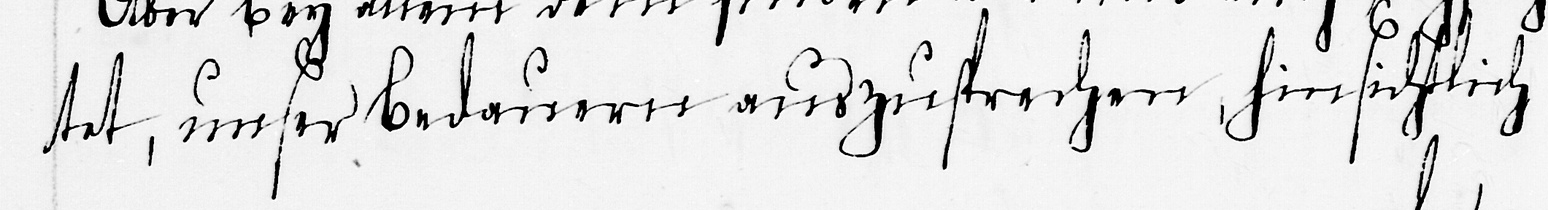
htet, unser Bedauern auszusprechen, hinsichtlich
